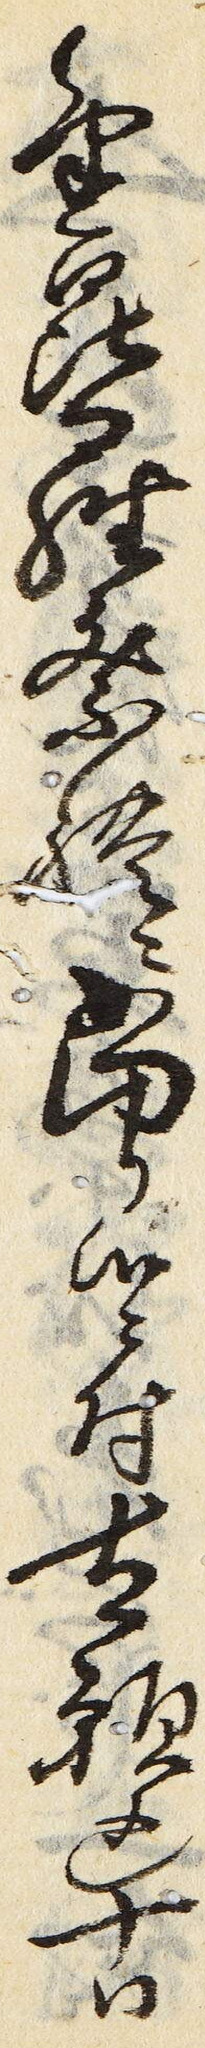之金毘羅祭礼ニ当り候ニ付立願込十日
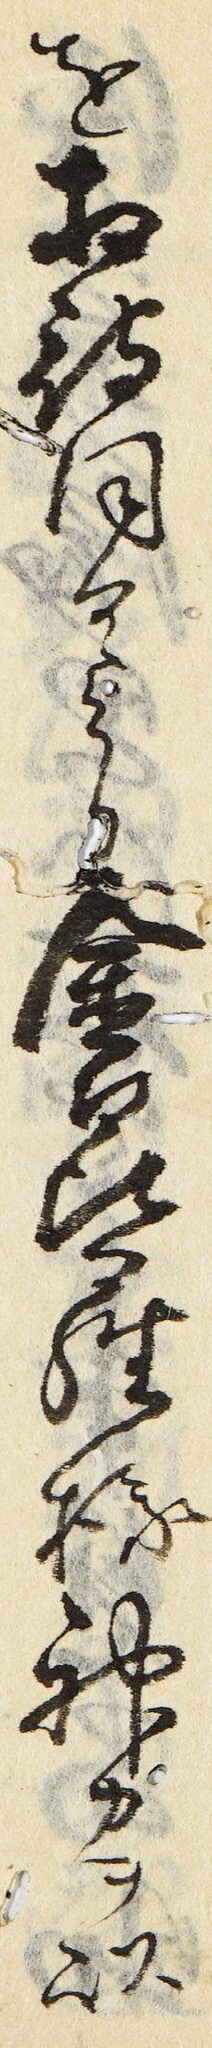を相待同日より金毘羅様神力を以
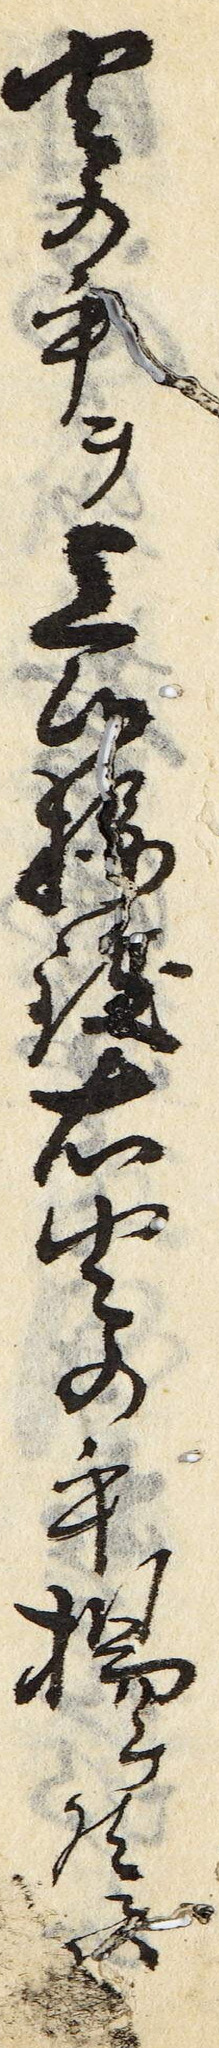火の手ヲ上候右火の手揚ケ候処
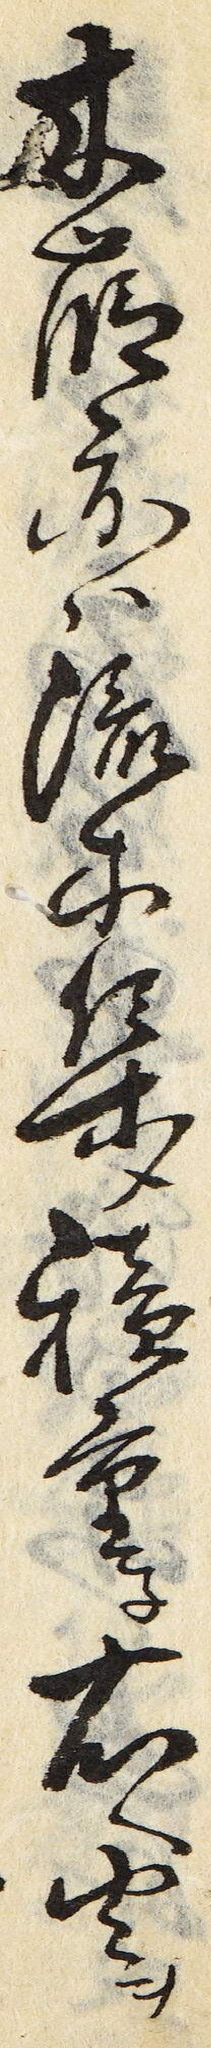木葭亦ハ流木集メ積重ネ右へ火ヲ
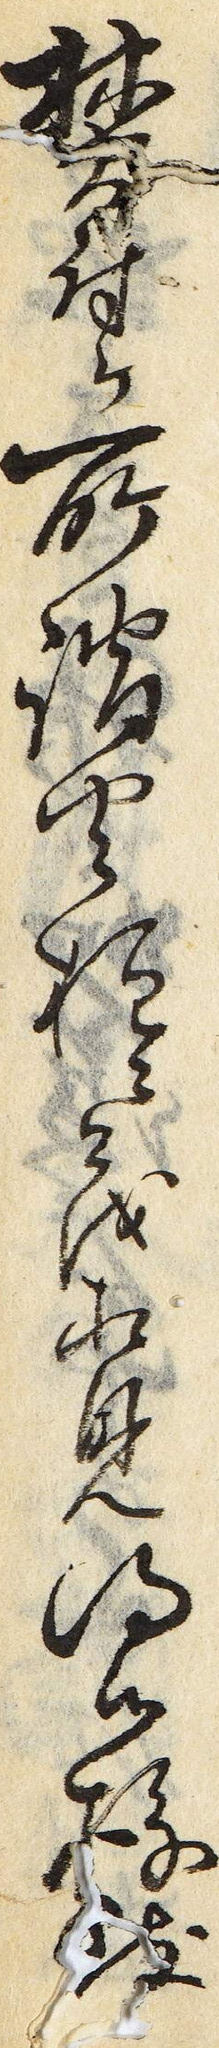焚付ケ所消火柱ニも相見得候様致

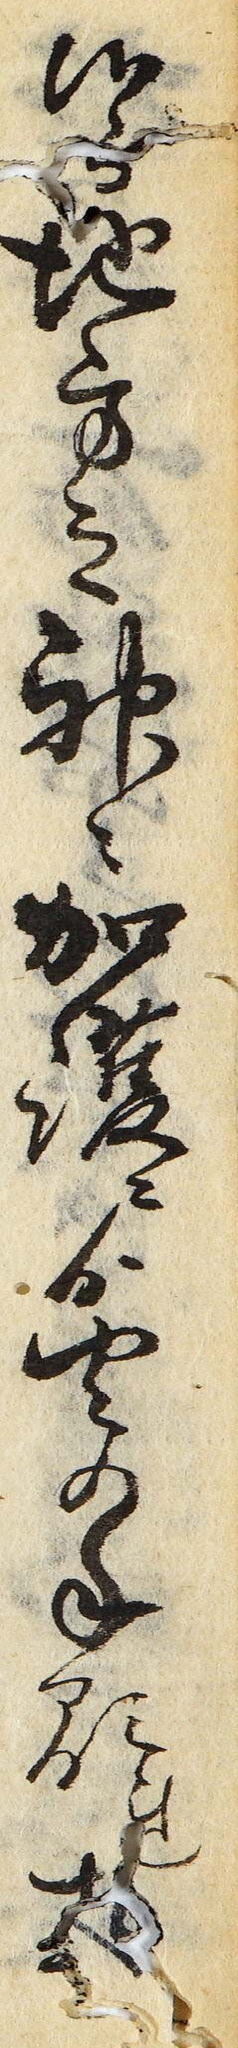候而地方之神々加護ニゟ火の手顕れ
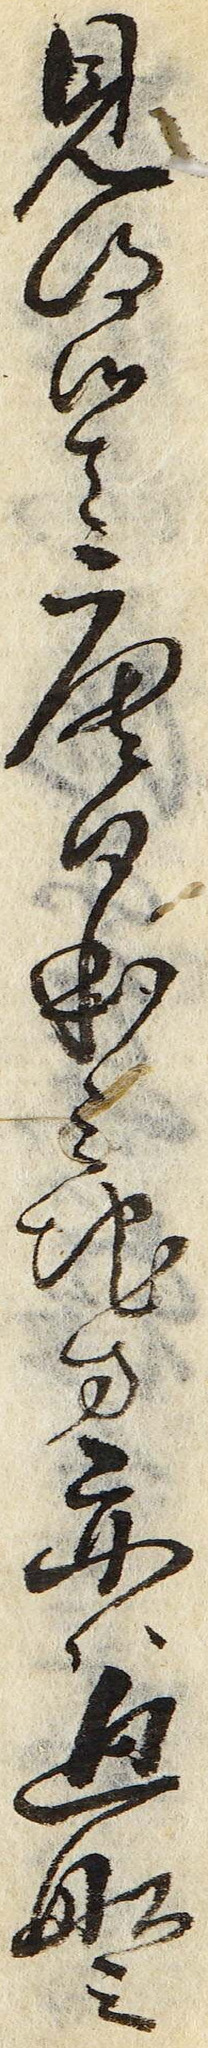見得候は唐日本之地方亦ハ廻船之
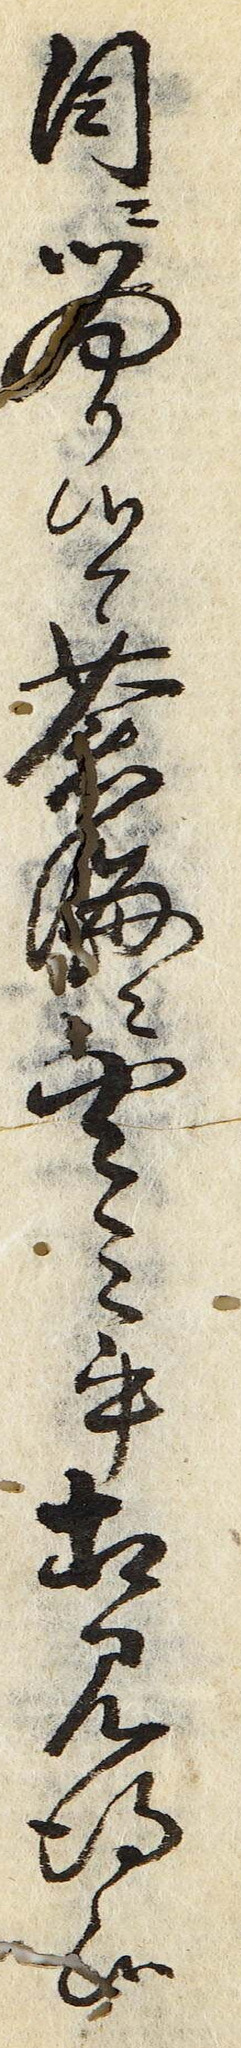目ニ留り候て蒼海ニ火の手相見得候
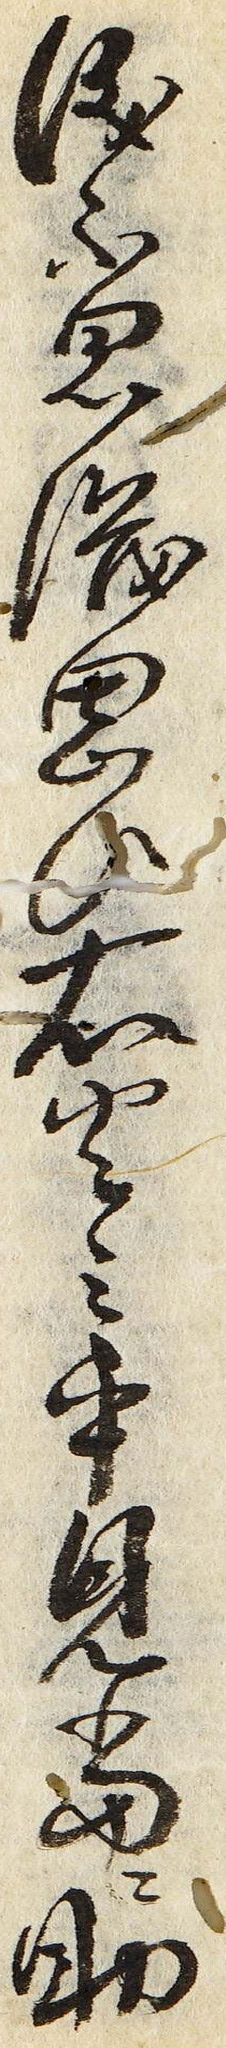儀不思儀思ひ右火の手見当ニ助
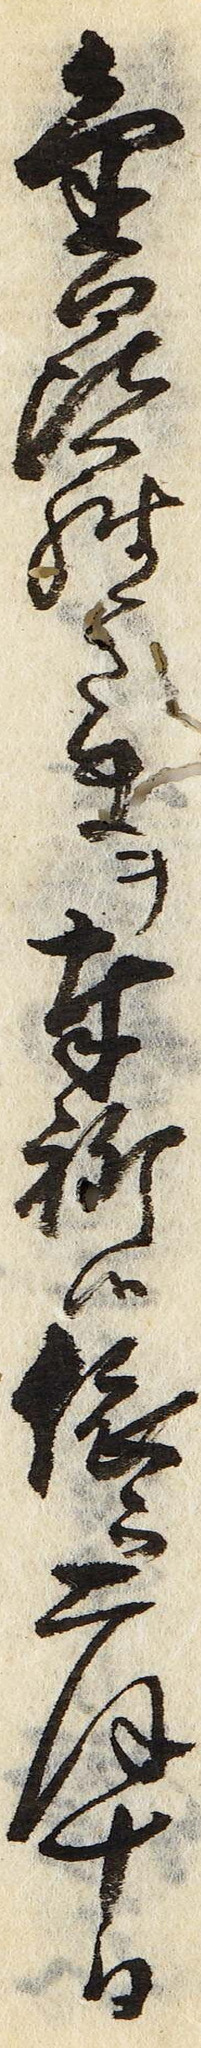金毘羅さまヲ奉祈候依而二月十日
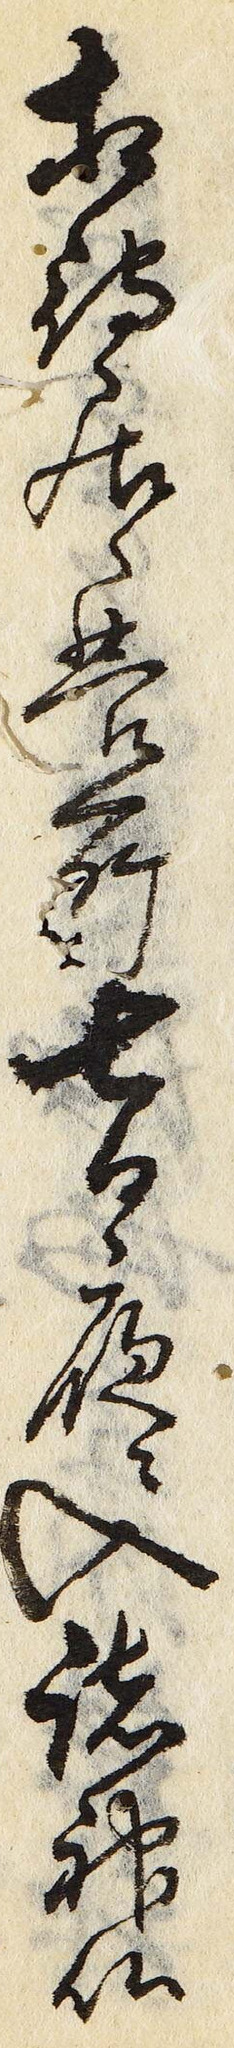相待居候然ル所七日夜ニ入諸神仏
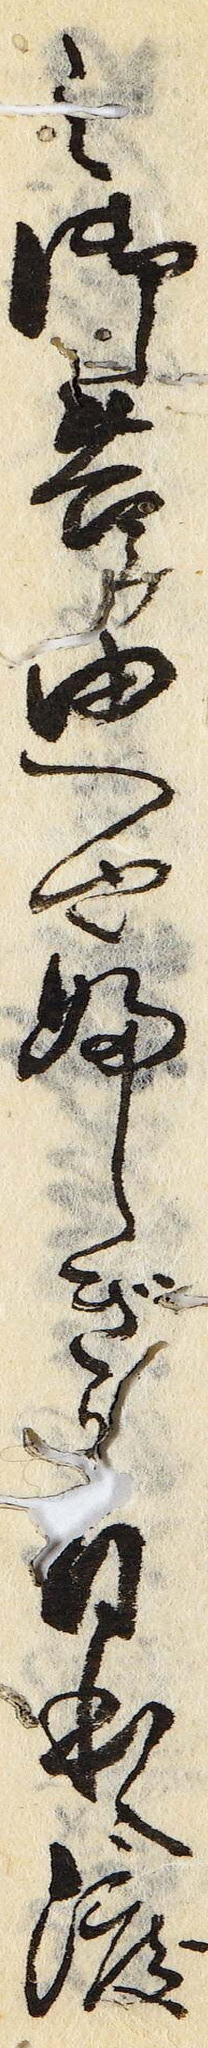之御告ケゆへやふしぎに日本へ渡
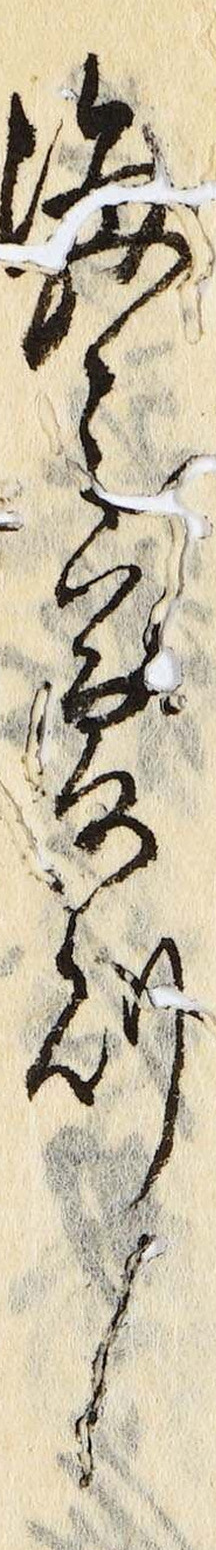海之夢則
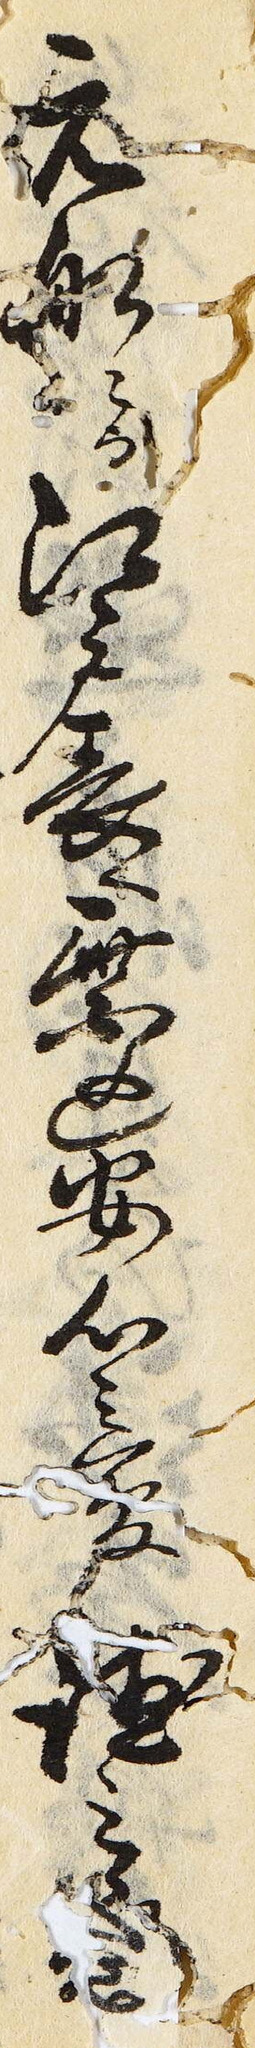元船ニ而江戸表へ乗込安心之夢徳之
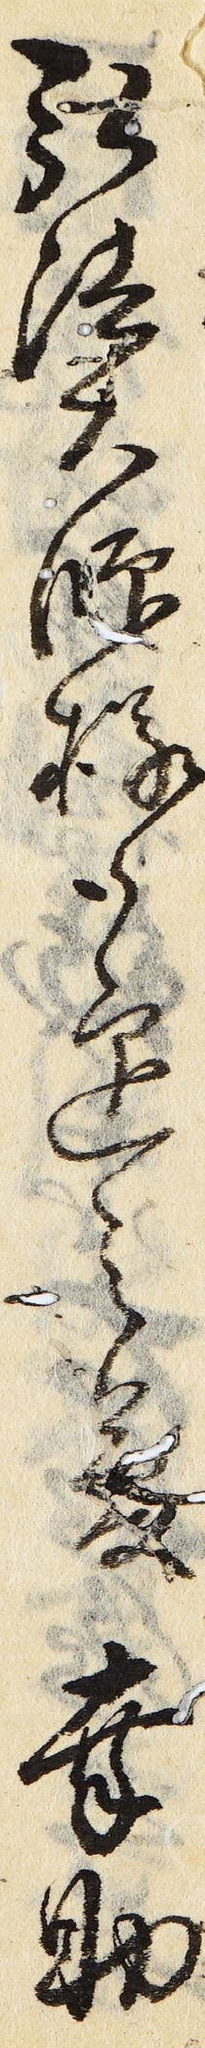弘法大師様御迎之御夢幸助
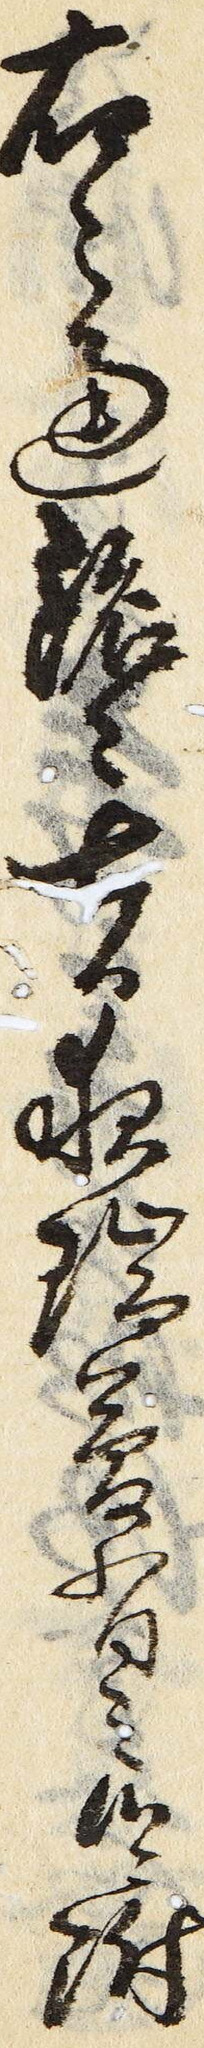右之通銘々七日夜瑞夢有之候ニ付
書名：阿波幸宝丸漂流記
